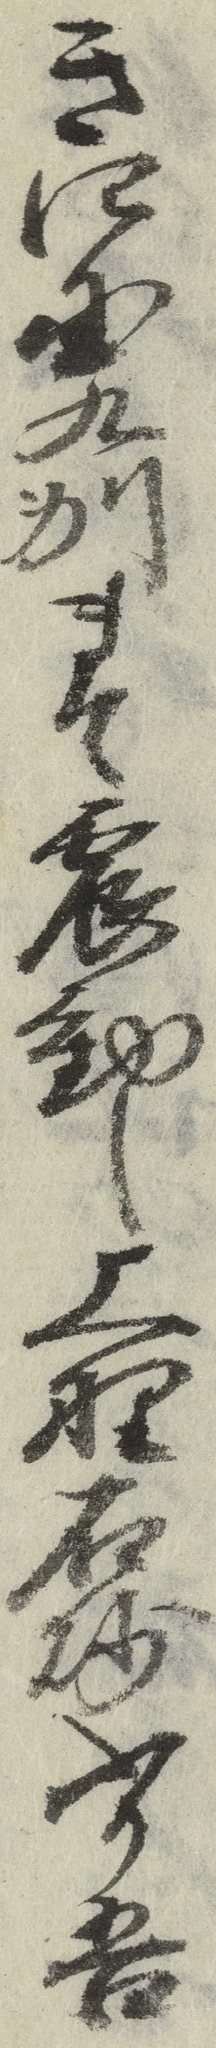き四国九州まて震動し上野石砂ふり吾
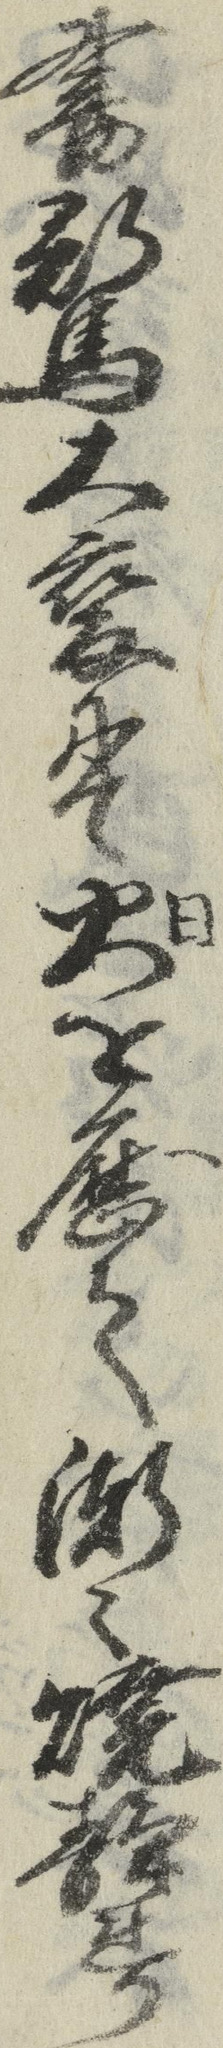妻郡馬大変にて火を歴て漸々焼静れり
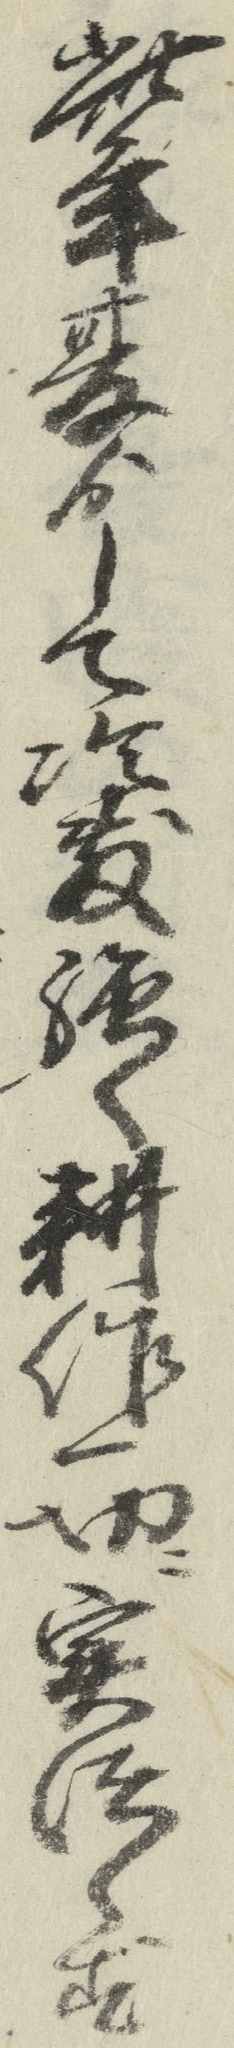此年夏ゟして冷敷強く耕作一切にみのらず
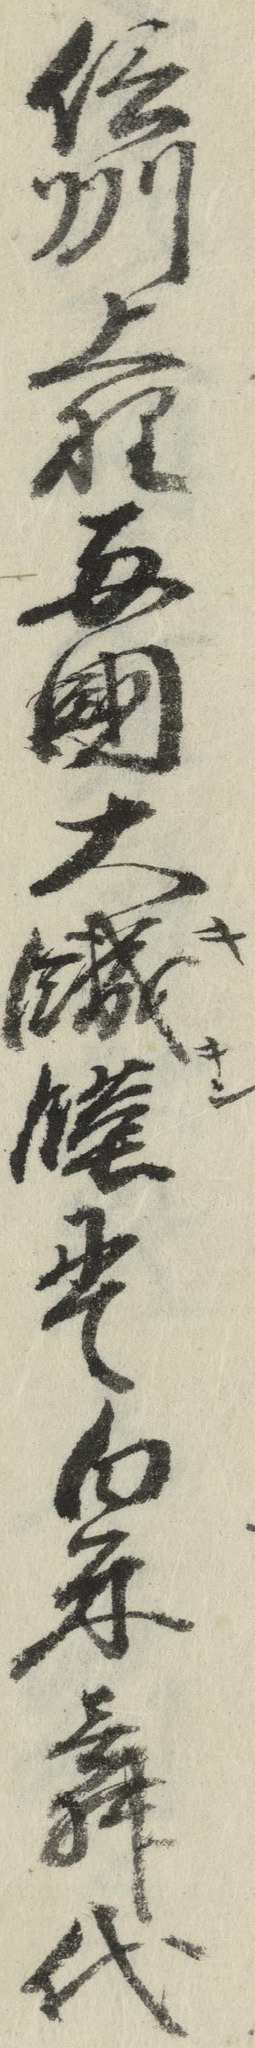信州上野両国大飢饉にて白米壱升代
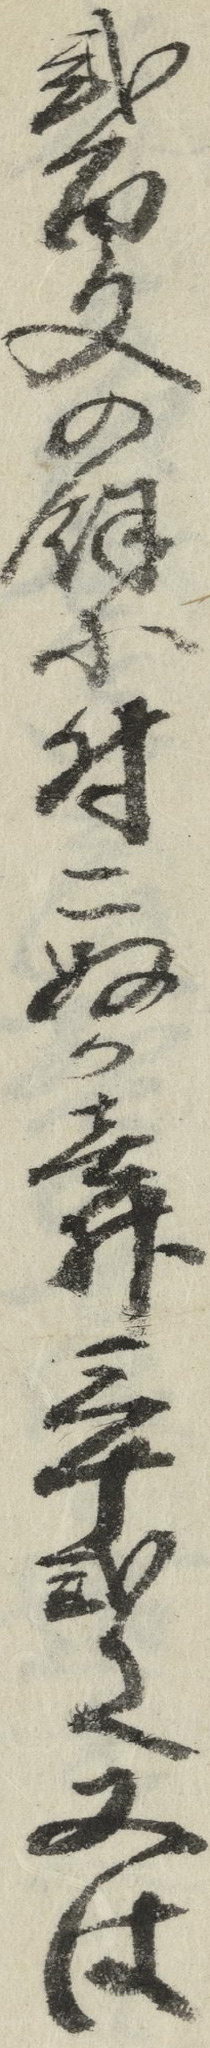弐百文の餘に付こぬか壱升三十弐文又は
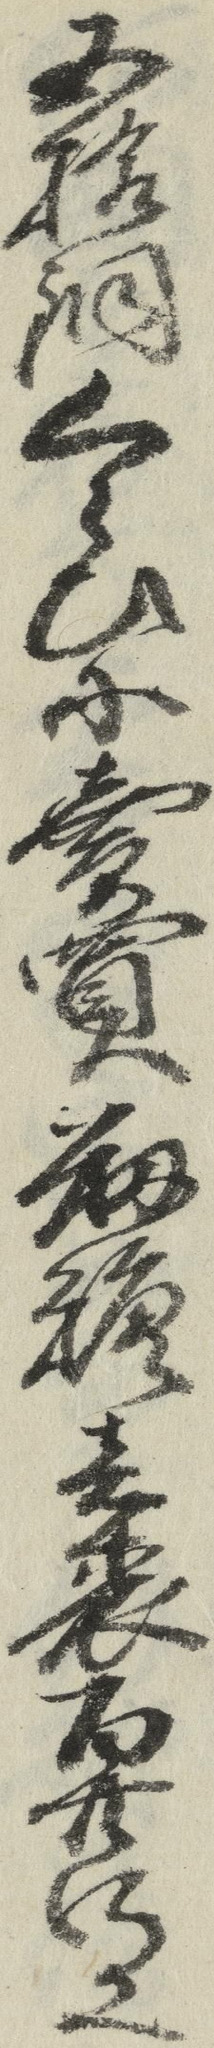五拾銅くらひに売買籾種壱表百廿四又
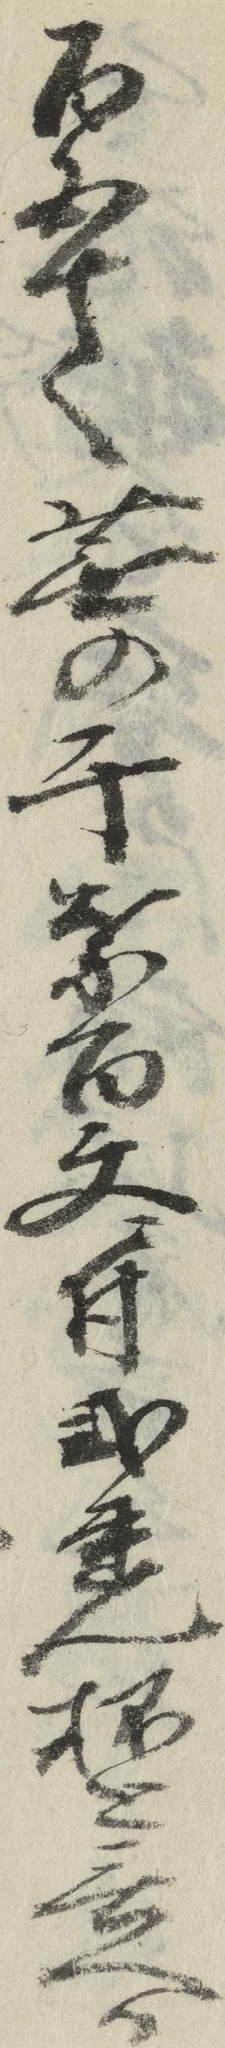百五十文蕪の干葉百文に付弐れん抔と云へる
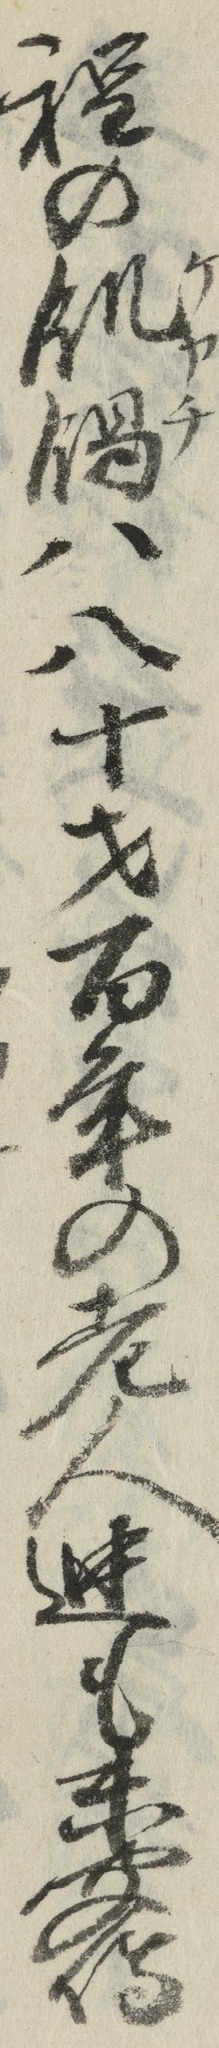程の飢鍋ハ八十才百年の老人迚も未聞伝
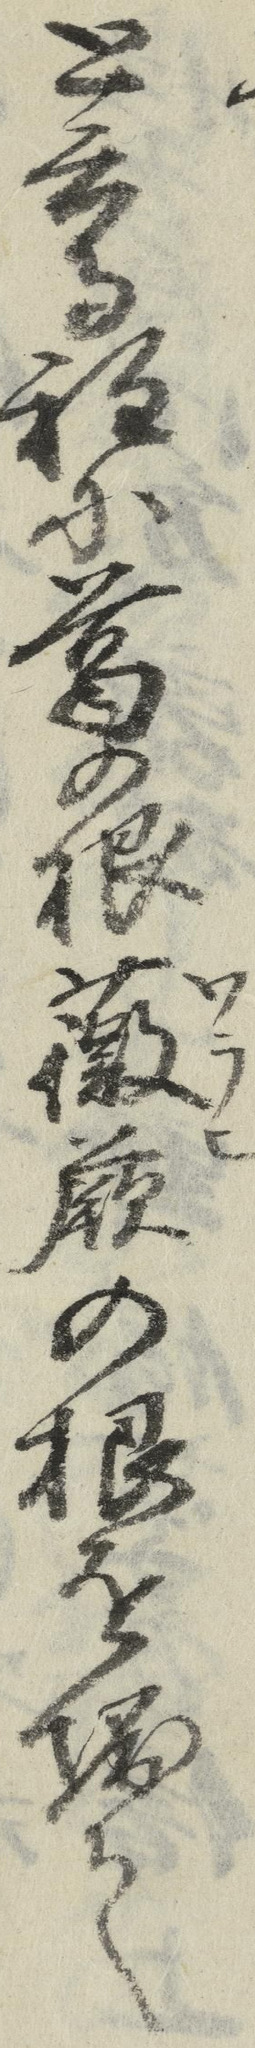と云る程に葛の根-薇蕨の根を掘て
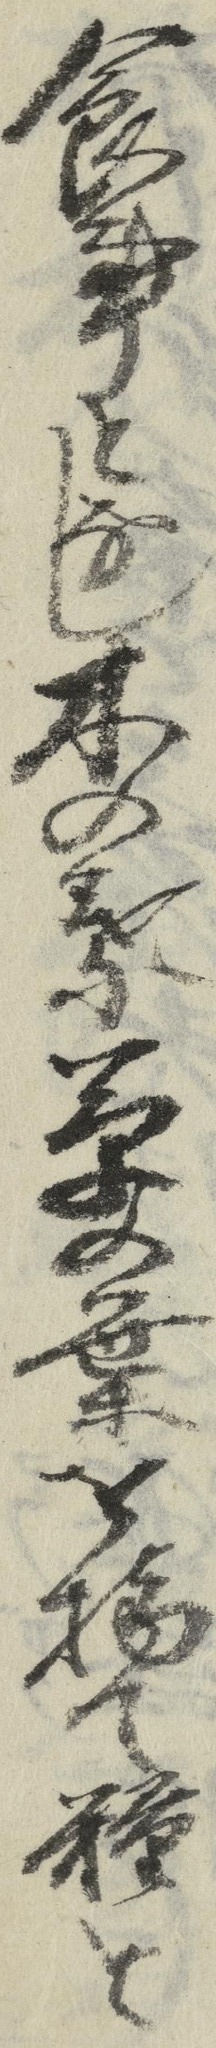食事となし木の葉草の葉を指て糧と

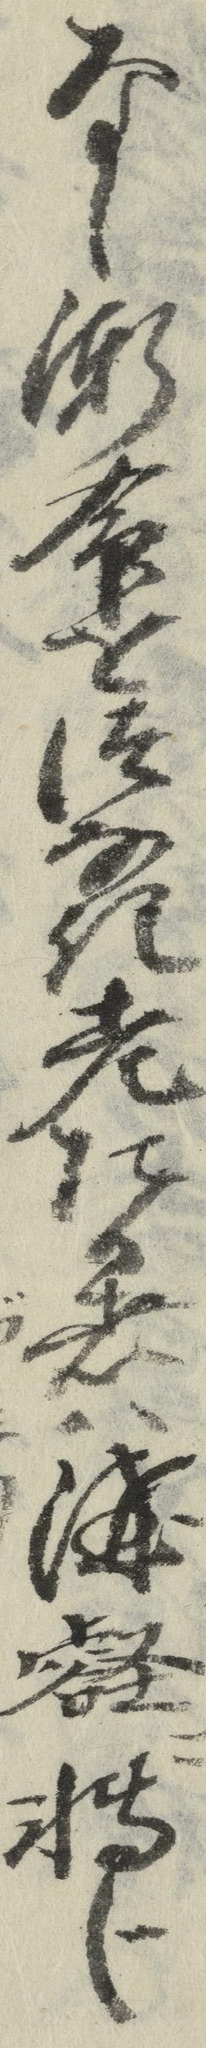なし漸食を御なき老たる者は溝壑に転じ
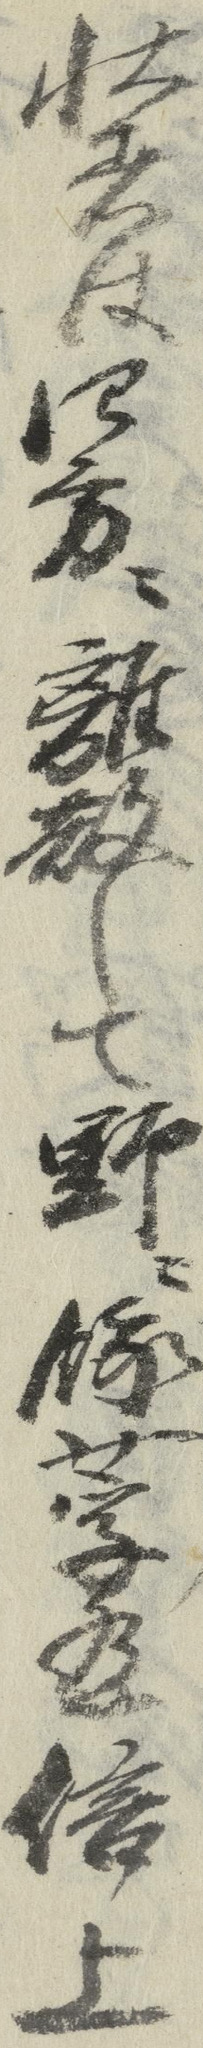壮者は四方に離散して野に餓莩有候信上
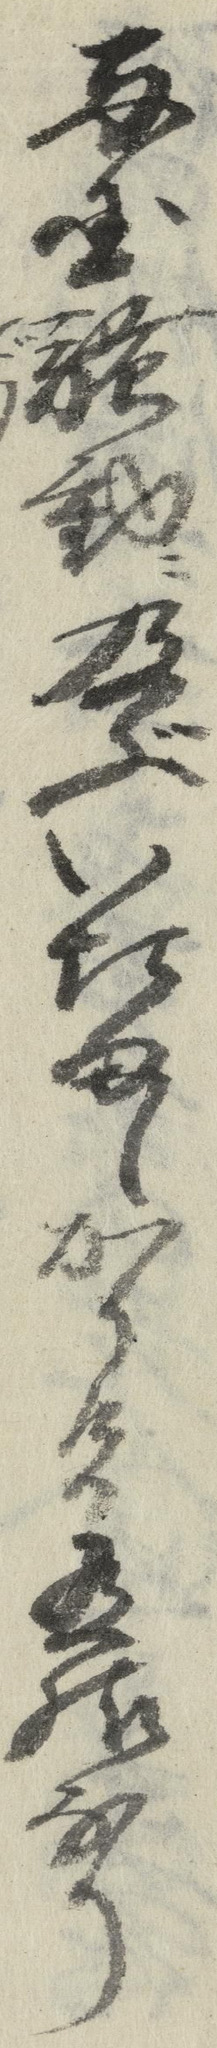両国騒動に及ぶいたましかりける有様なり
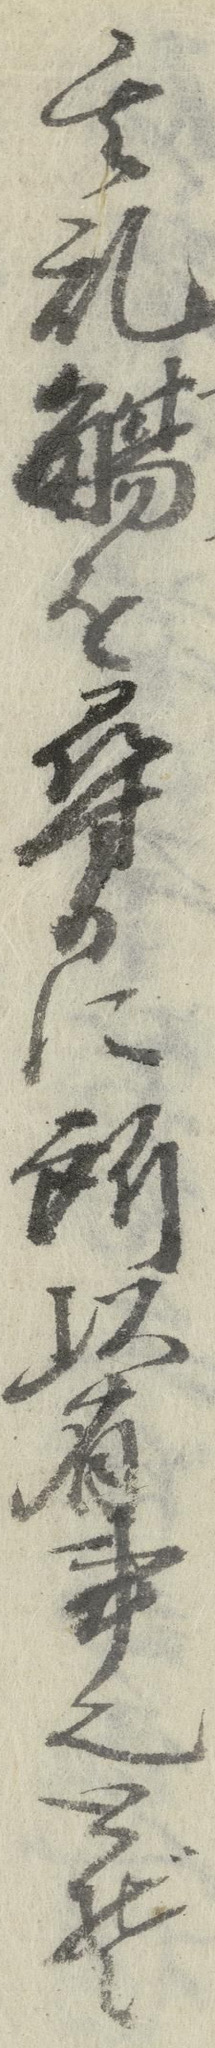其礼觴を尋るに所以有事也とぞ
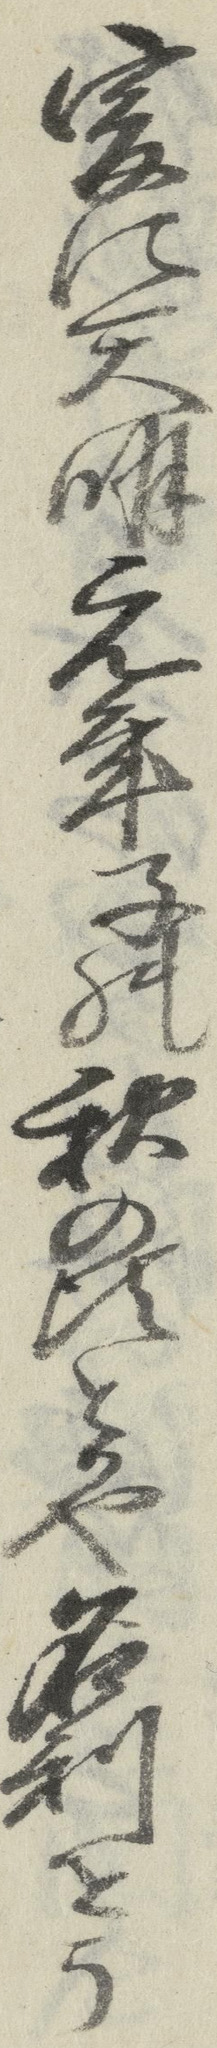爰に天明元年子の秋の頃とかや名利をう
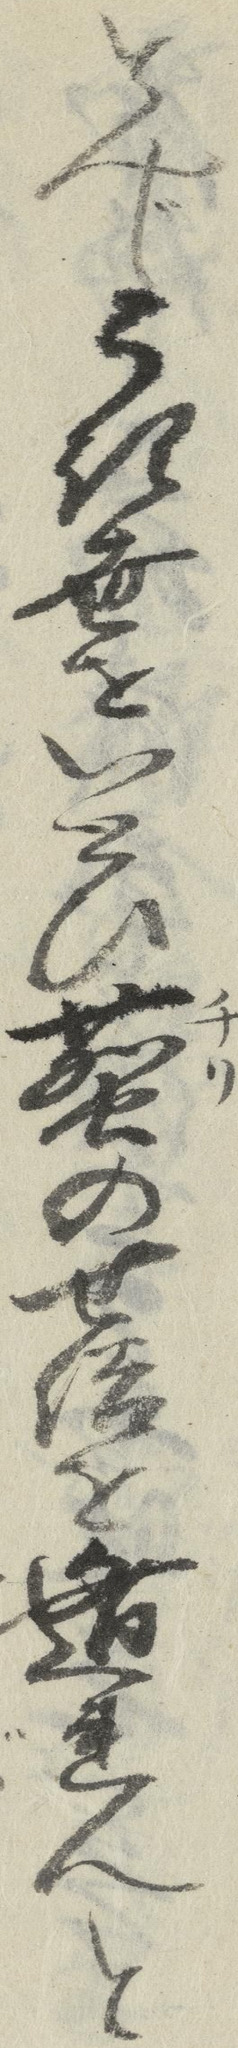とんじうき世をいとひ塵の世俗を遁れんと
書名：浅間大焼騒動記　上
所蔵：東京大学地震研究所図書室 Earthquake Research Institute Library, The University of Tokyo, JAPAN
